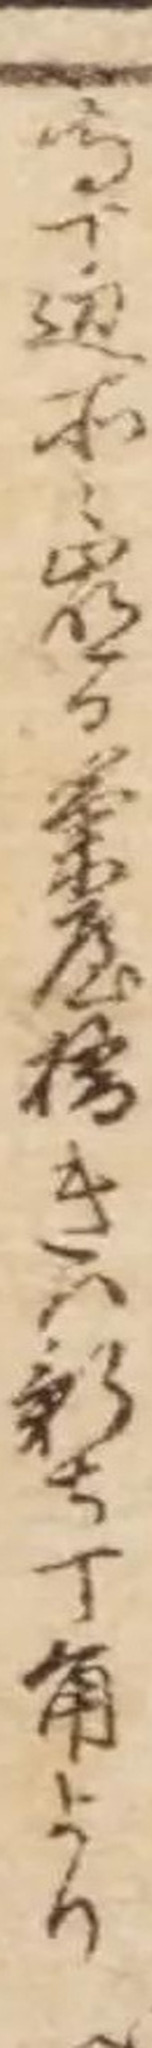寺丁所〻崩る茶屋橋きは新寺丁角より
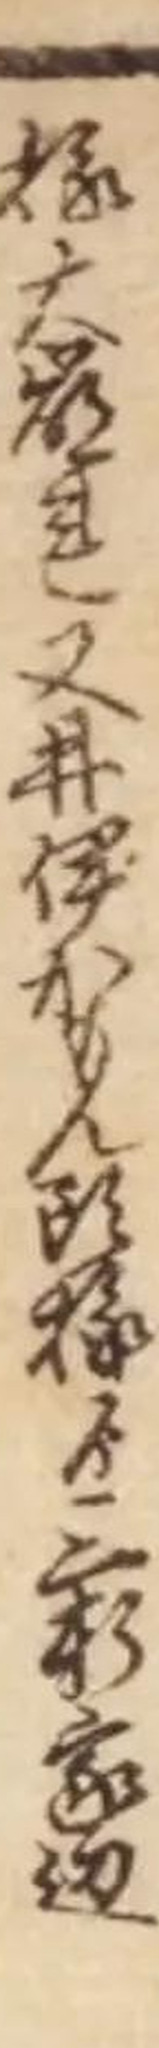様大崩れ又井伊かもん頭様より三軒家辺
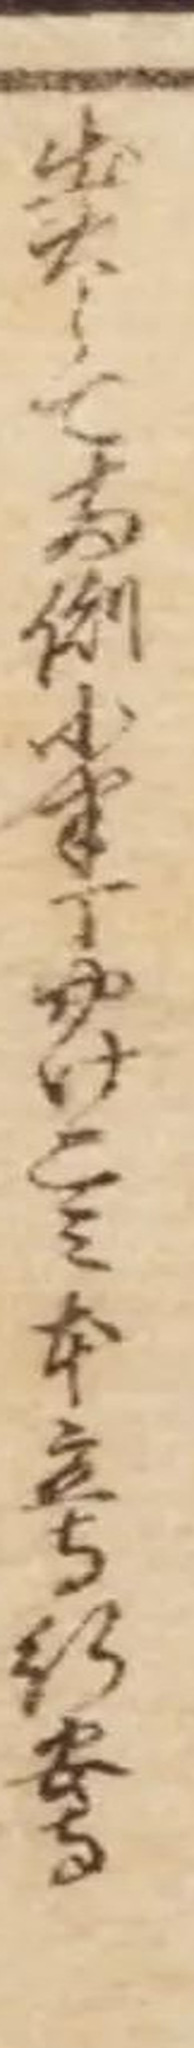出火して両側小半丁やけこみ本立寺行安寺
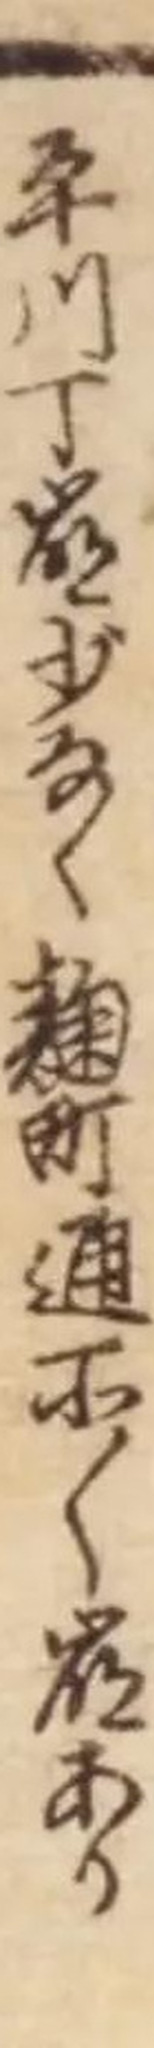平川丁崩少なく麹町通所〳〵崩あり
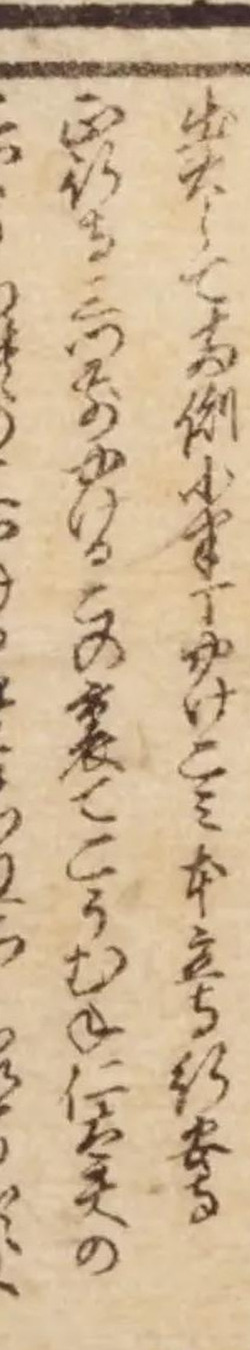正行寺三門前やけるこの裏てこうむね仁太夫の
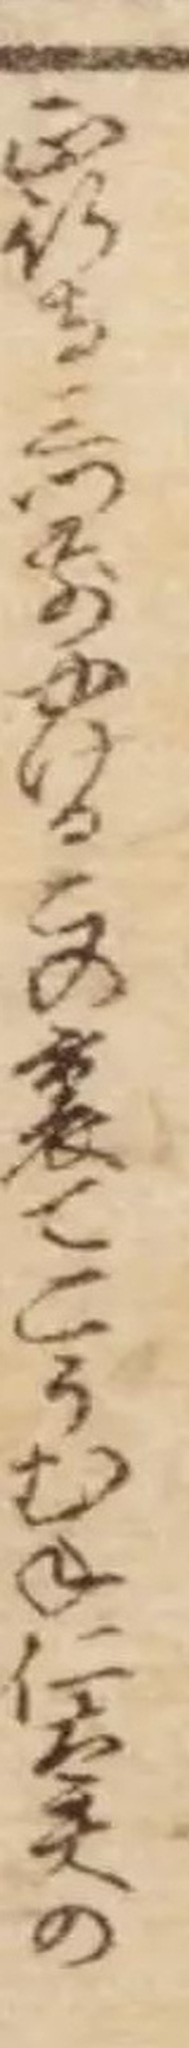正行寺三門前やけるこの裏てこうむね仁太夫の
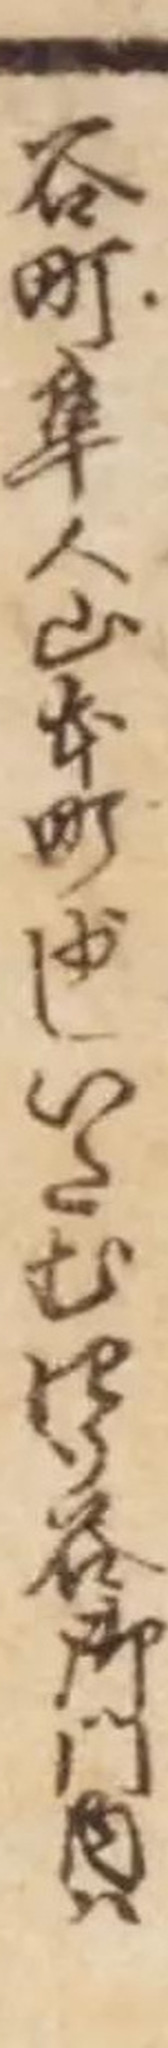谷町隼人山本町少しいたむ四ツ谷御門内は
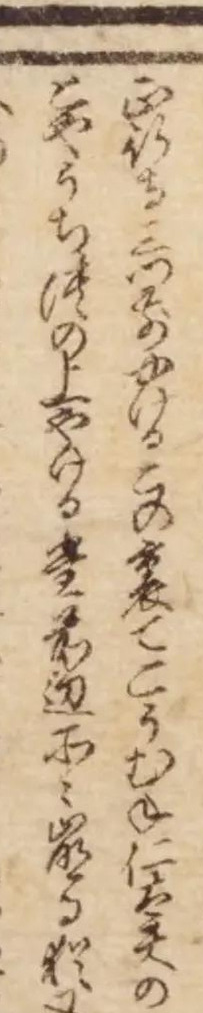こやうち潰の上やける前辺所〻崩る猶又
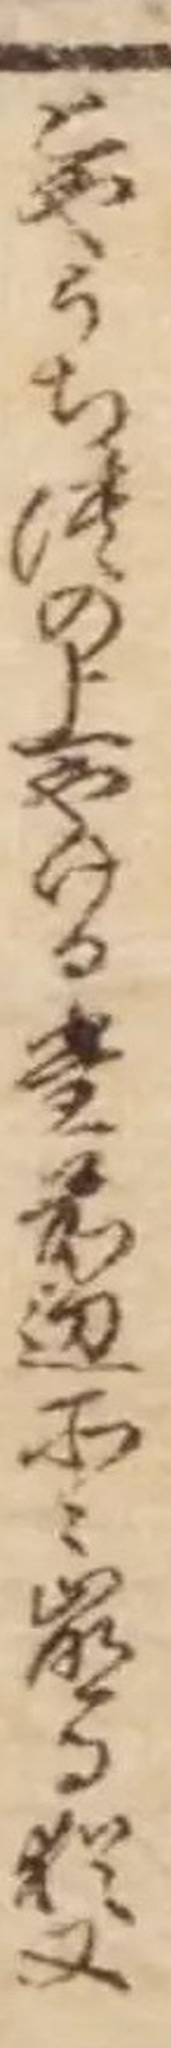こやうち潰の上やける前辺所〻崩る猶又
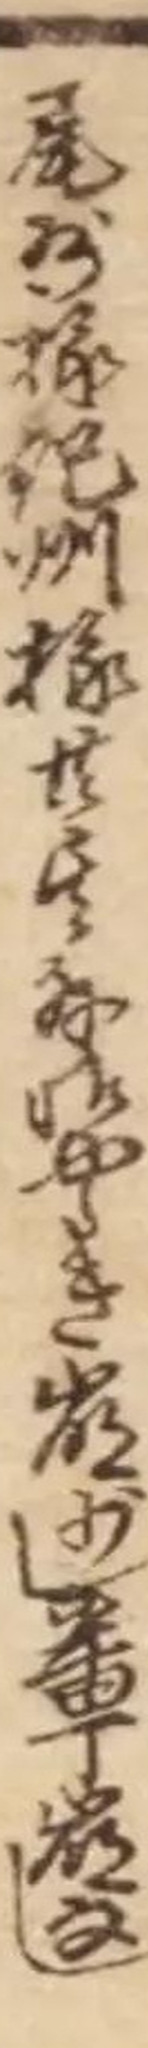尾州様紀州様共其外御やしき崩少し番丁崩なし
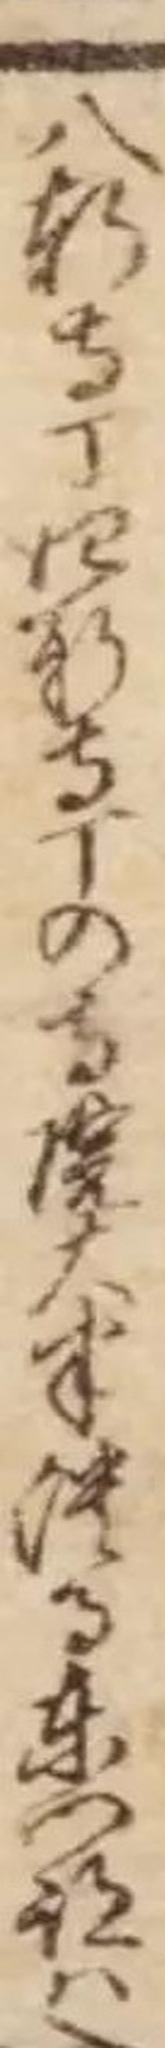八軒寺丁四軒寺丁の寺院大半潰る東門跡は
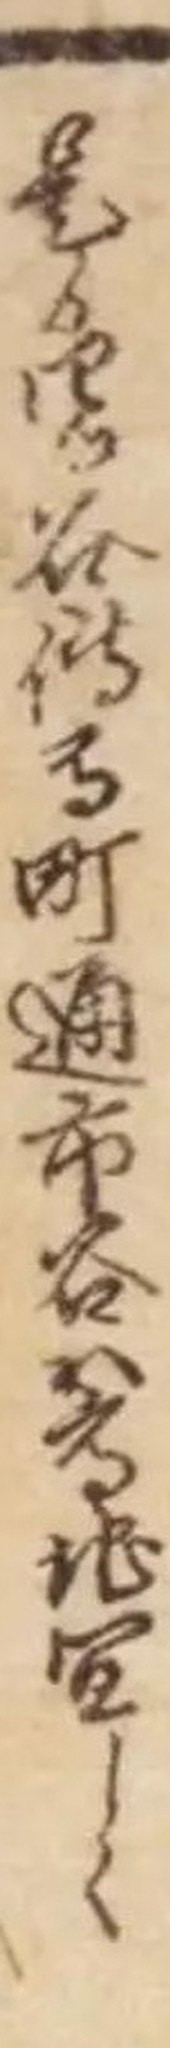是より四ツ谷傳馬町通市谷は高地宜しく
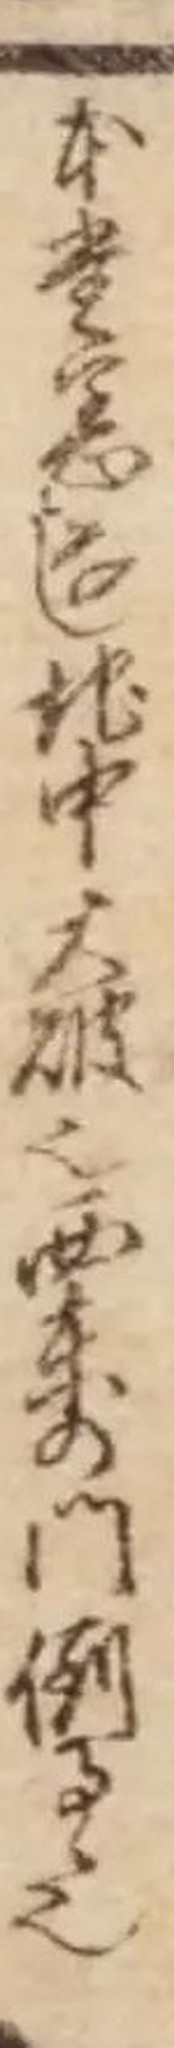本堂恙なし地中大破也西東の門倒るゝ也
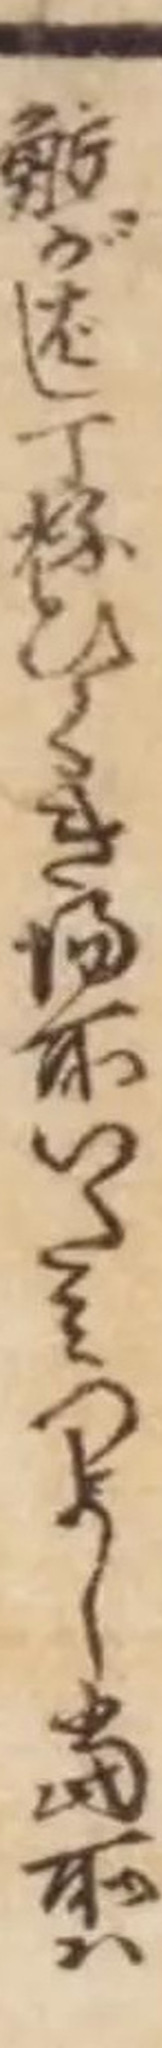鮫がばし丁縁ひくき場所いたみつよし當所は
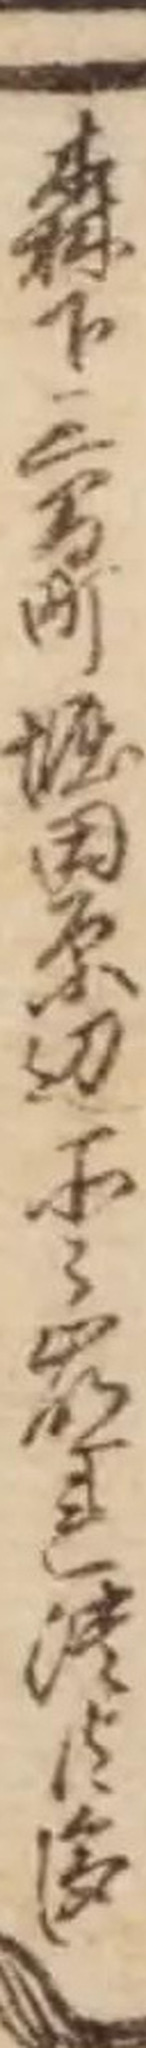森下三間町堀田原辺所〻崩れ潰共多し
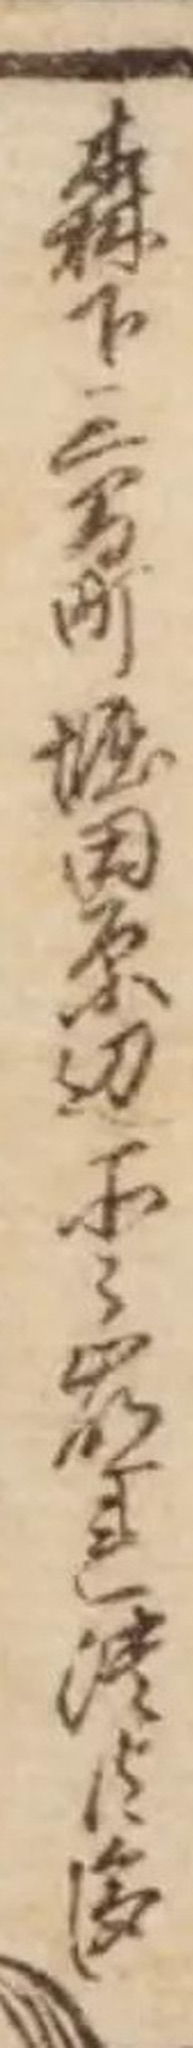森下三間町堀田原辺所〻崩れ潰共多し
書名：御江戸関八州大地震出火巨細記
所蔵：国立国会図書館 National Diet Library, JAPAN
